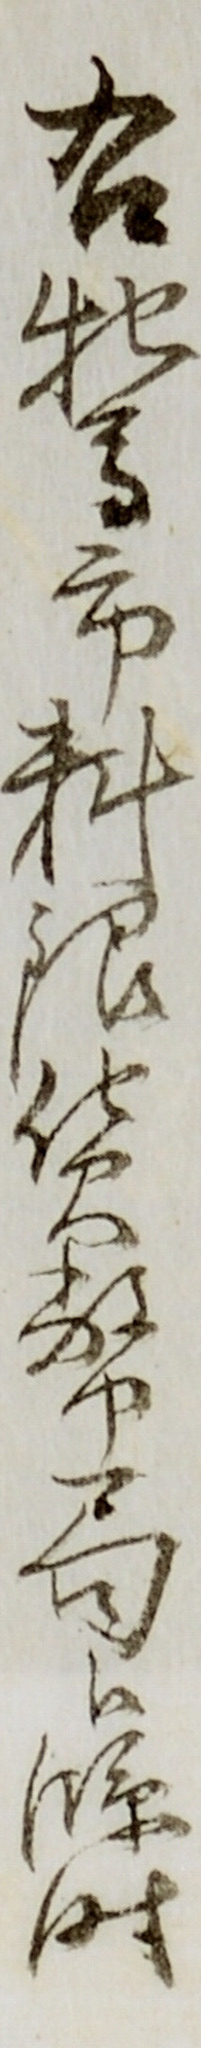右牝馬市料銀貨幣局え臨時
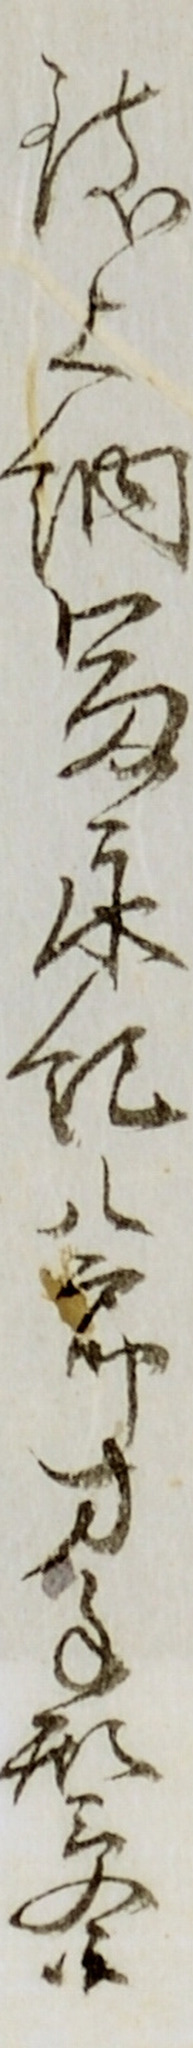致上納富永紀八郎方手形受
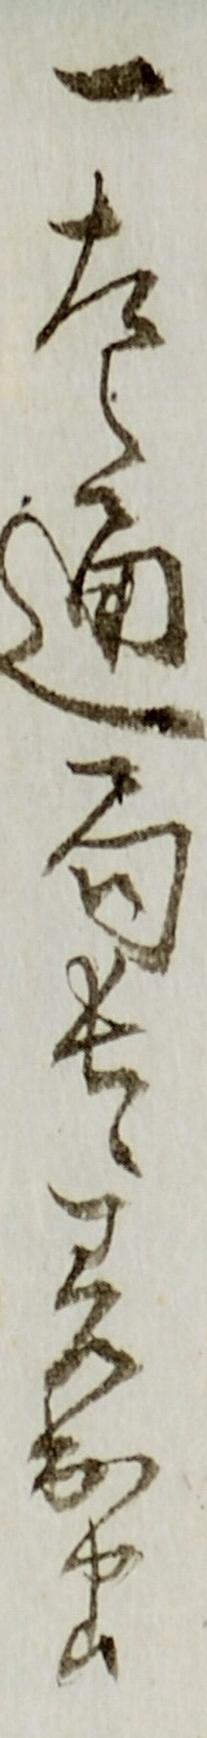一左之通局長へ差出申候
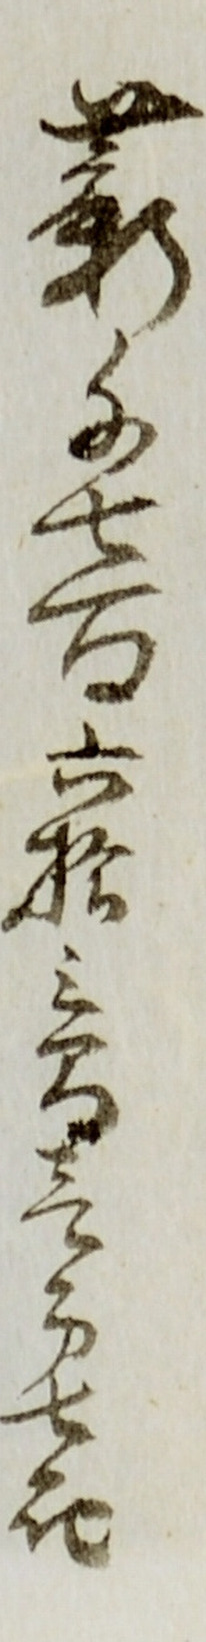薪千七百六拾三間壱分七厘
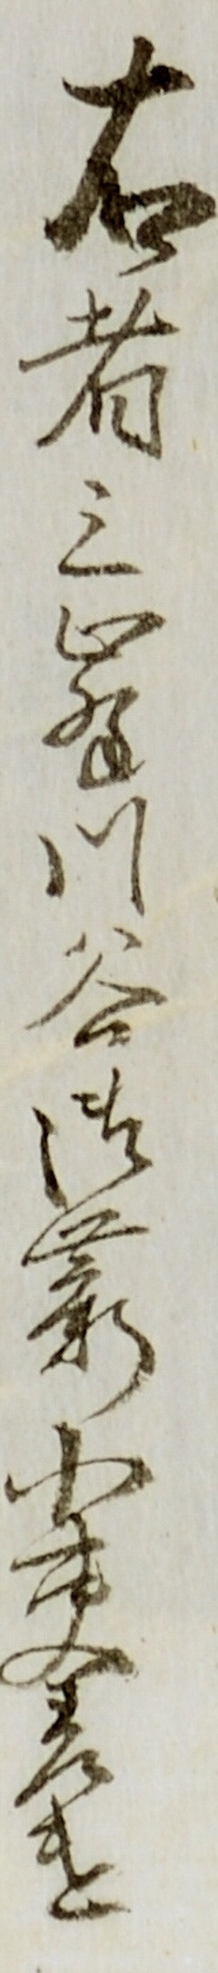右は三峯川谷御薪小吏差遣
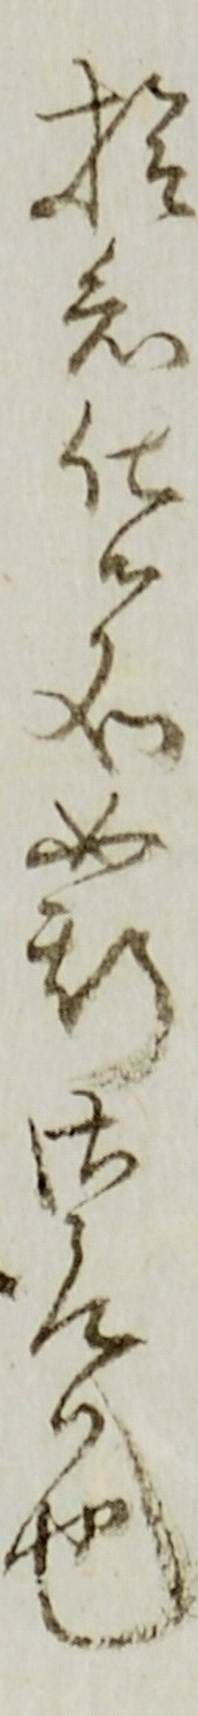検知仕候処如斯御座候也
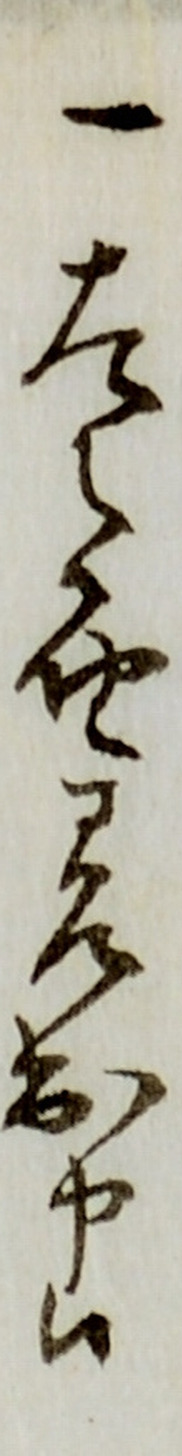一左之届差出申候
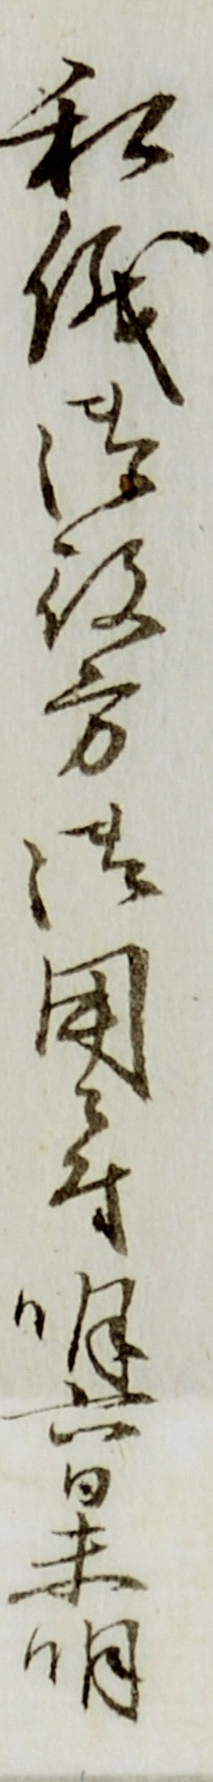私儀御役方御用に付明六日未明
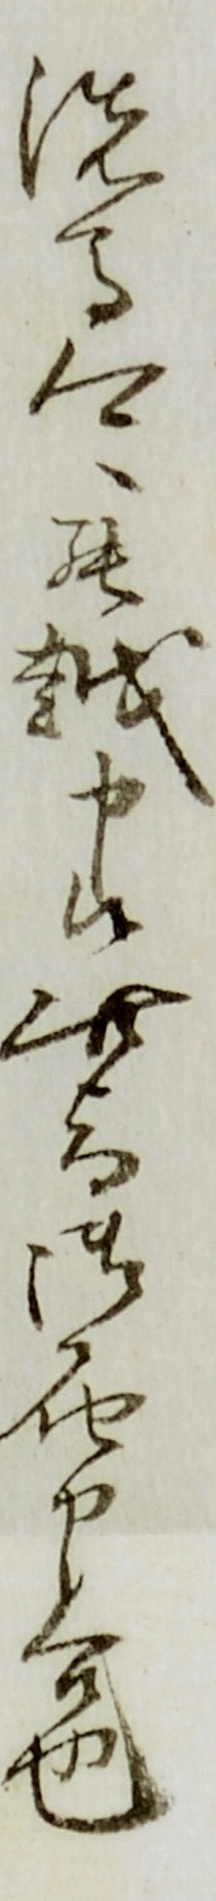洗馬郷へ罷越申候此旨御届申上候也
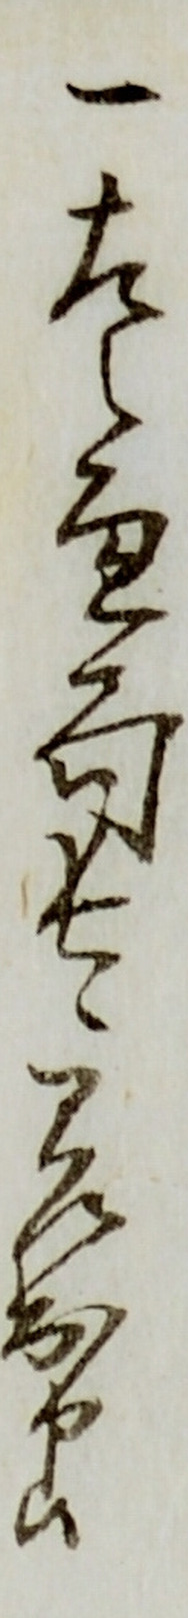一左之通局長へ差出申候
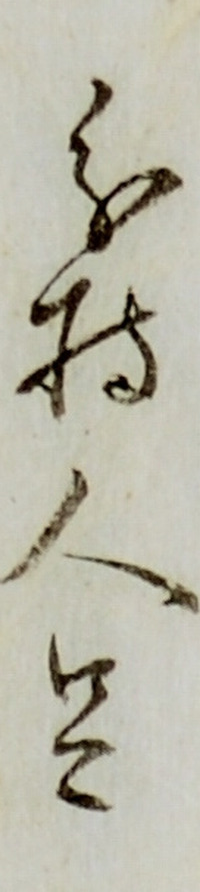分持人足
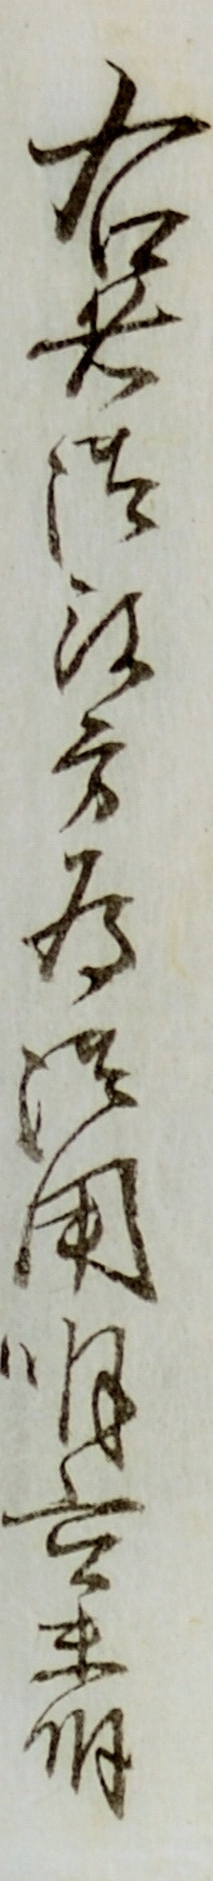右は御役方為御用明六日未明

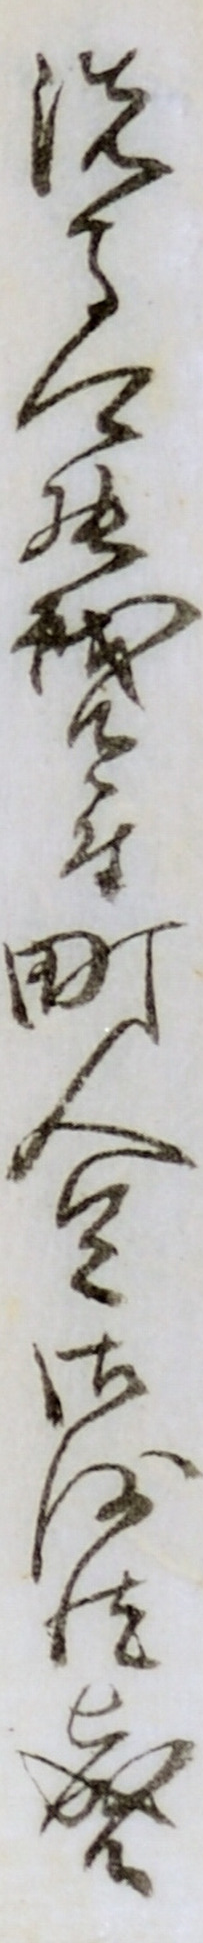洗馬郷罷越候に付町人足御沙汰被成下
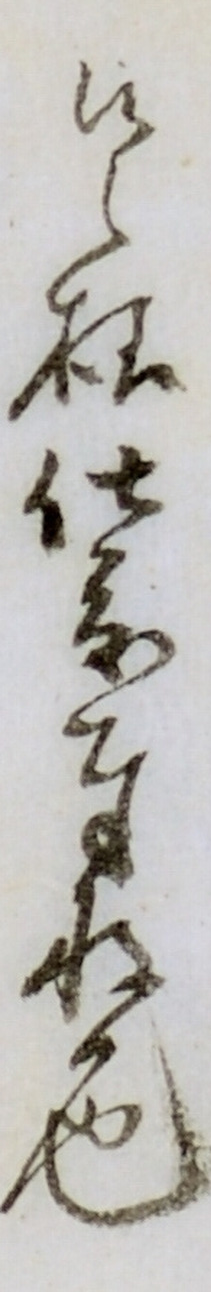候之様仕度奉存候也
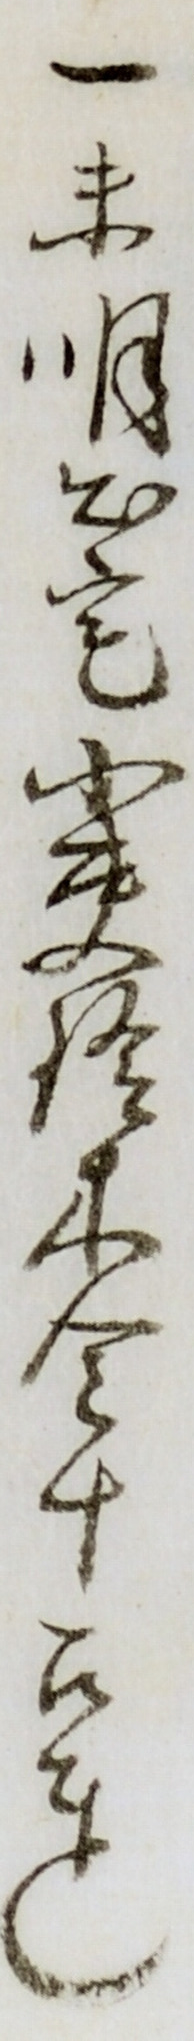一未明出宅小吏鈴木金十召連
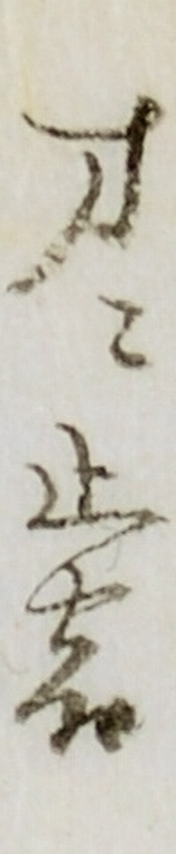方に止宿
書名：山林方諸事御用留
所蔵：伊那市立高遠町図書館・合同会社AMANE
